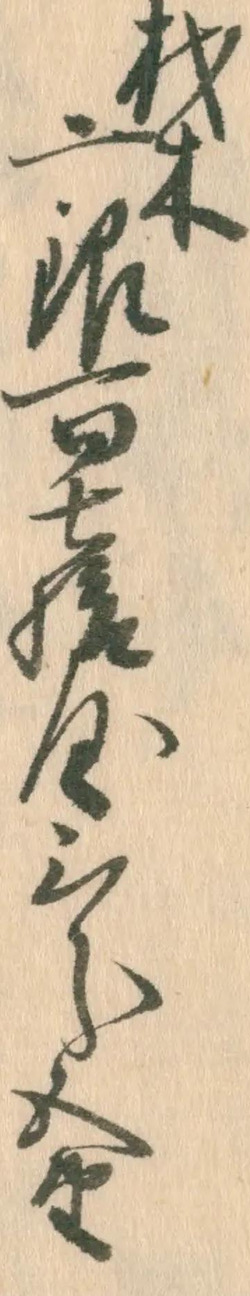〆銀百七拾匁三分五厘
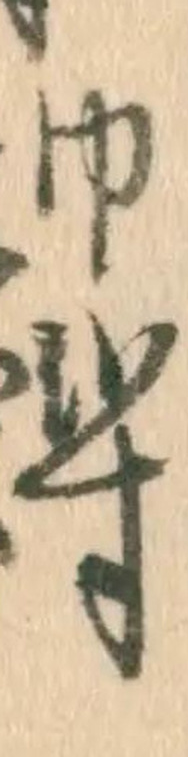厚弐寸
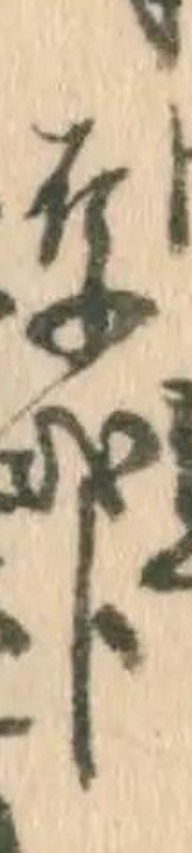厚弐寸
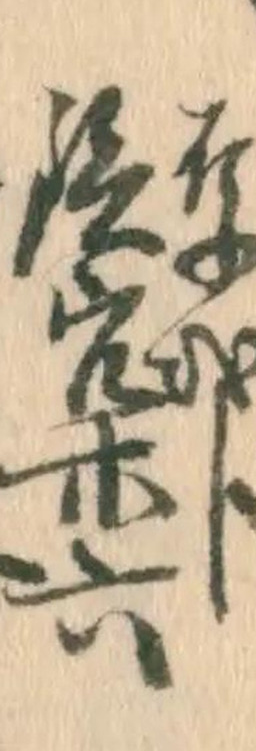鋲穴廿六
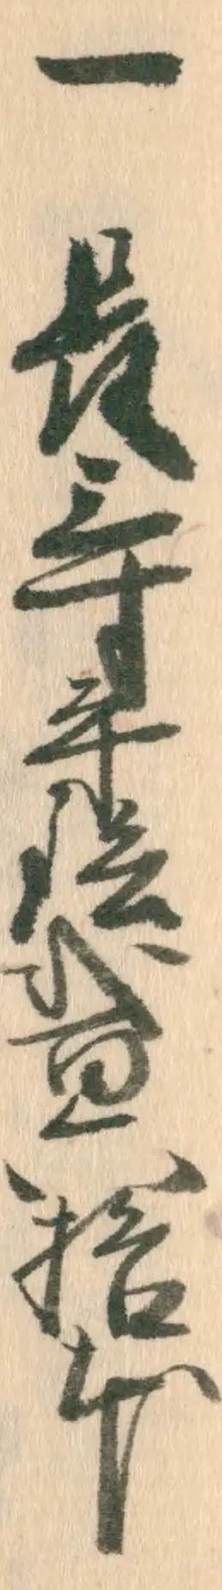一長三寸平鋲弐百六拾本
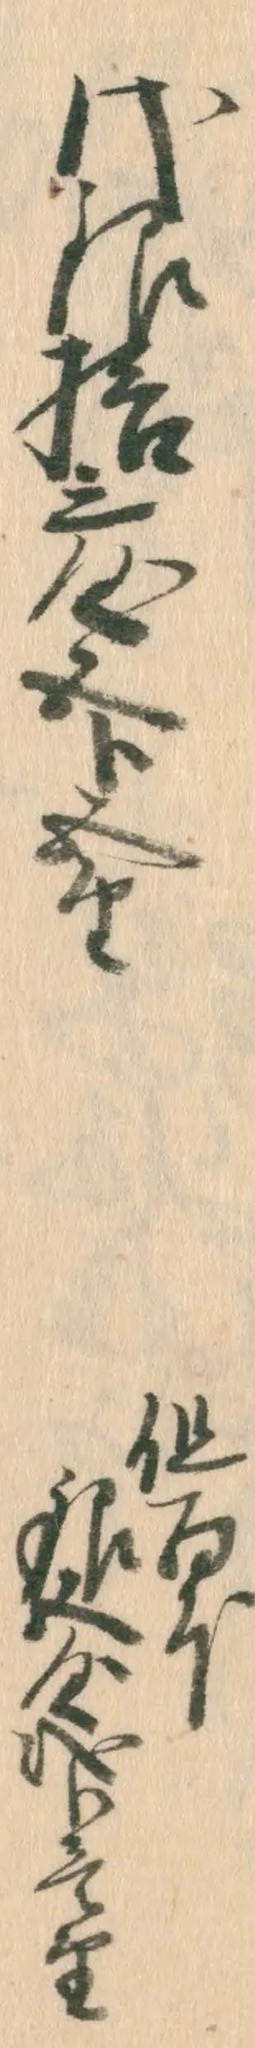代銀拾三匁五分五厘但百本銀五匁弐分壱厘
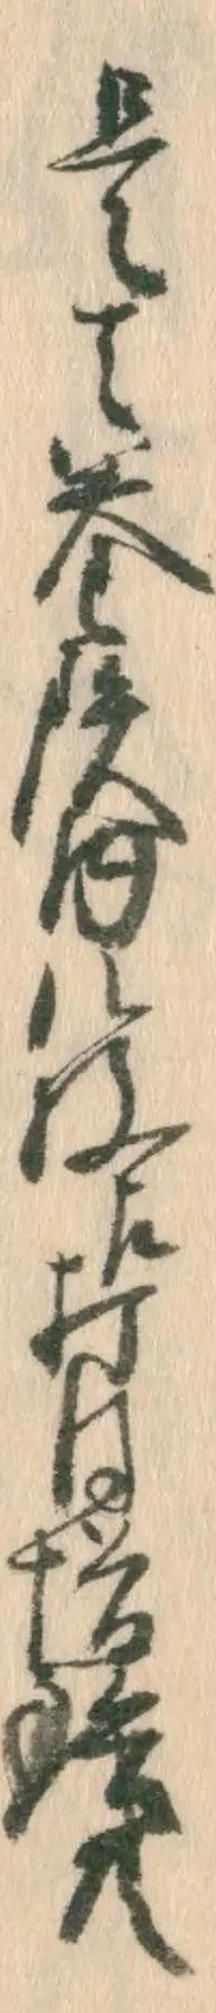是は巻鉄物八枚え打付増鋲共
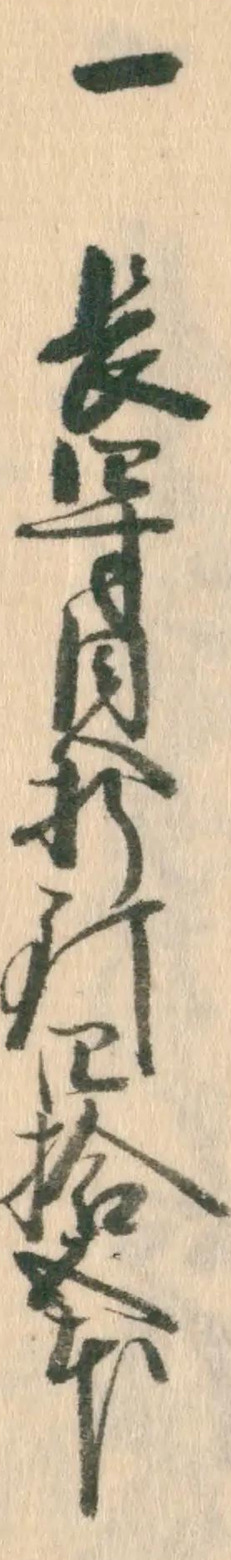一長四寸貝折釘四拾五本
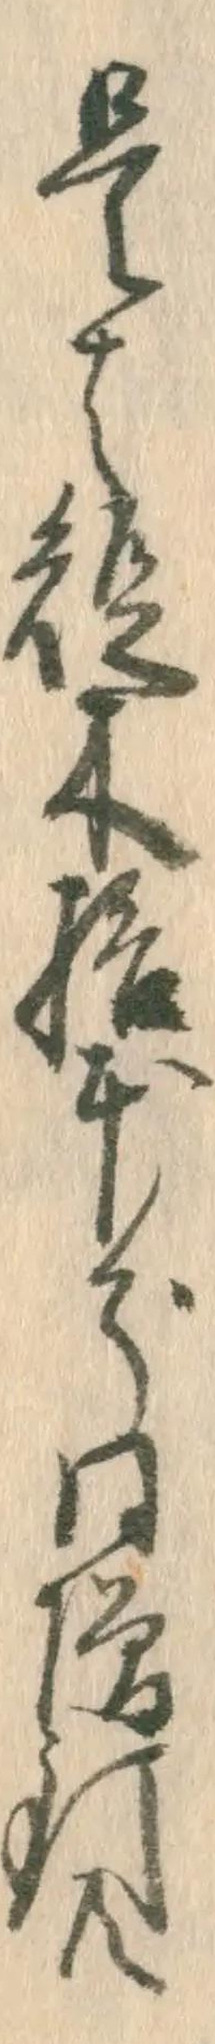是は短木拾本分同増釘共
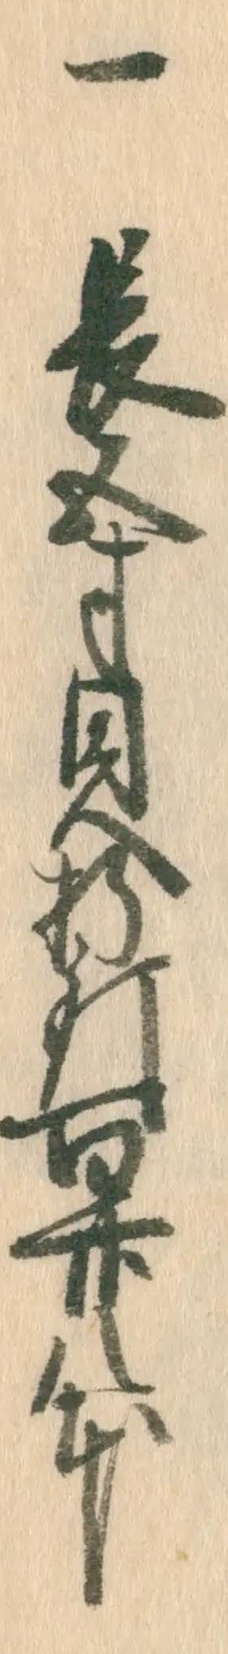一長五寸貝折釘百廿八本

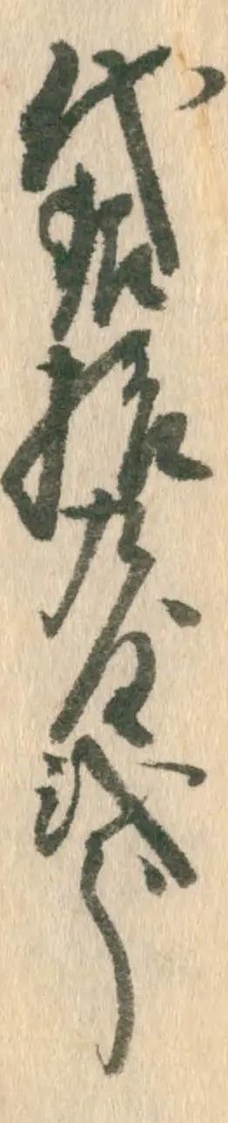代銀九匁六分
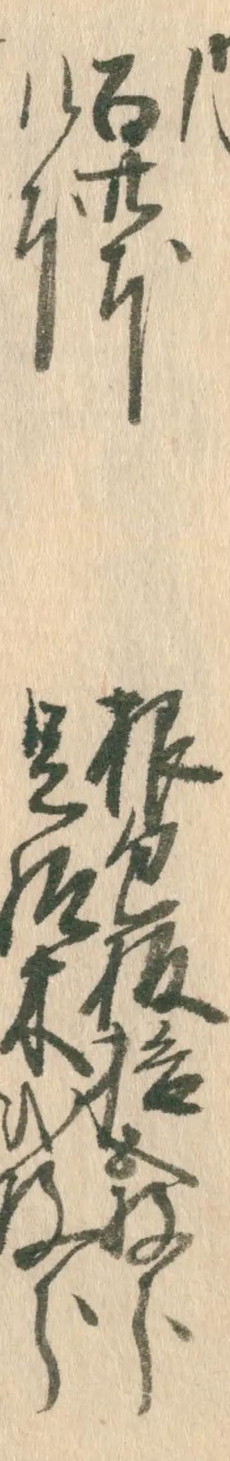百廿本根包板拾五枚分
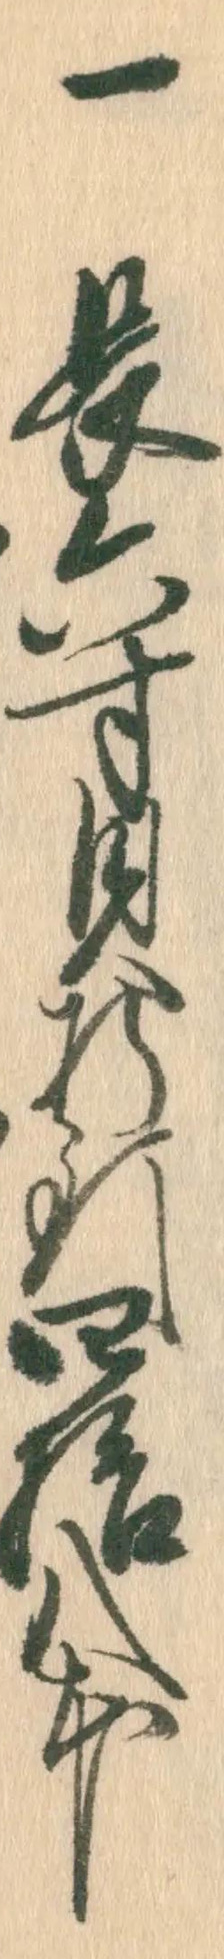一長六寸貝折釘四拾八本
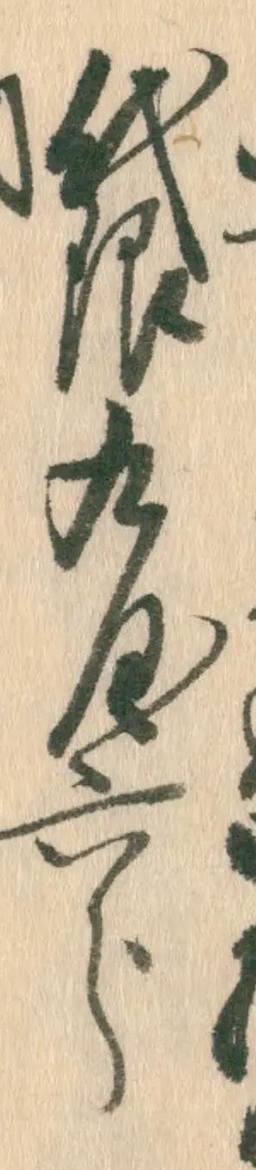代銀九匁六分
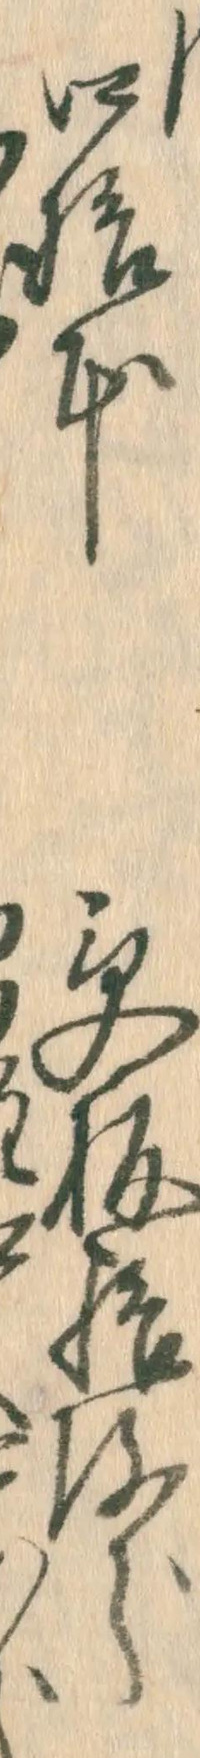四拾本受板拾枚分
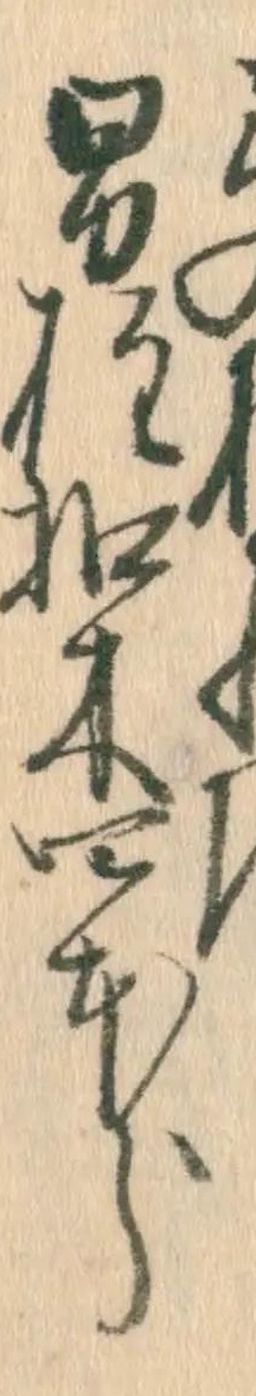八本男柱扣木四本分
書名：三橋 17巻. [8] 三橋小破御修復書留　但御奉行御掛リ替地震潰橋番屋　嘉永四亥年より安政二卯年迄　下
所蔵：国立国会図書館 National Diet Library, JAPAN
